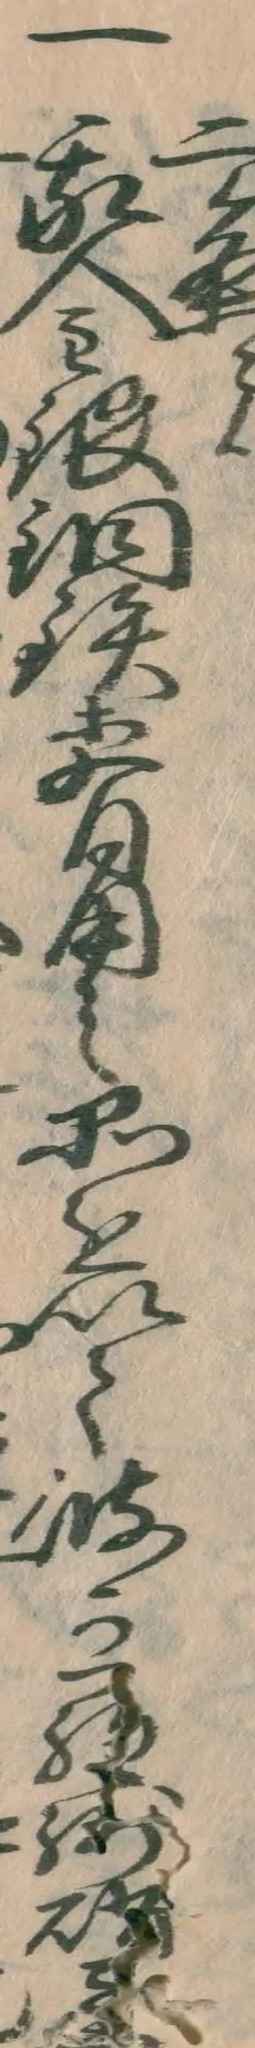一我金銀銅鉄等有用之品を以て彼か羅紗硝子等
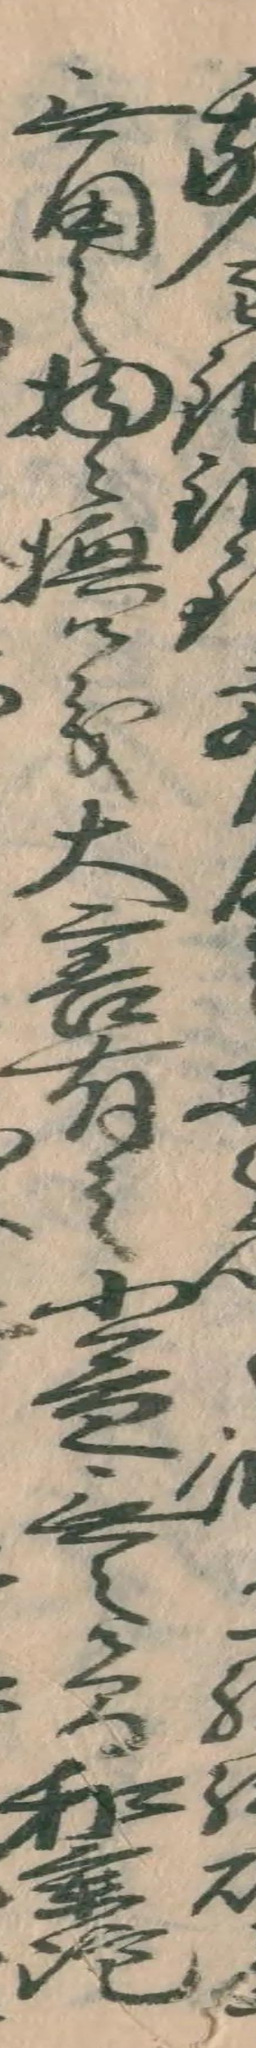無用之物ニ換候義大害有之小益無之候間和蘭陀
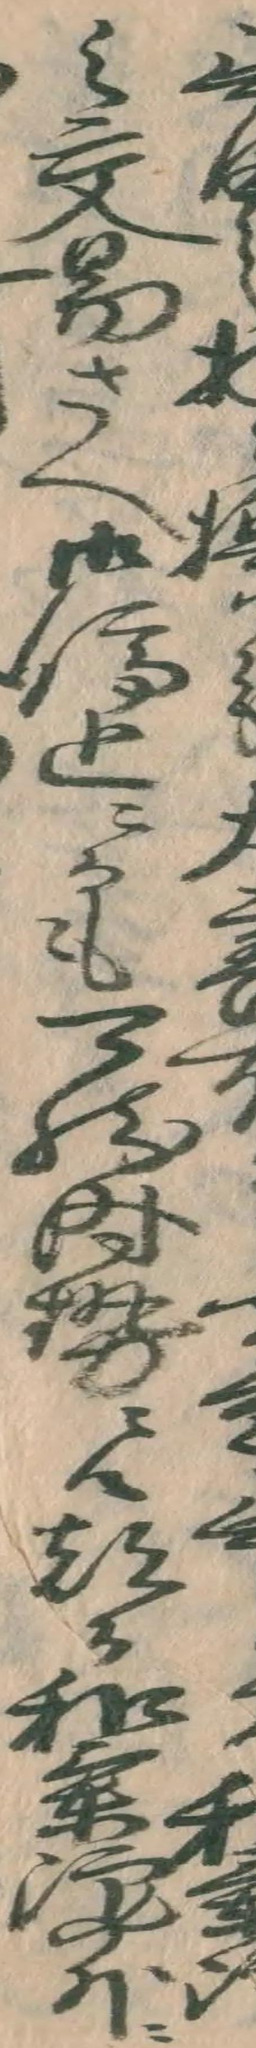之交易さへ御停止ニ而も可然時勢ニ候都而和蘭陀の外ニ
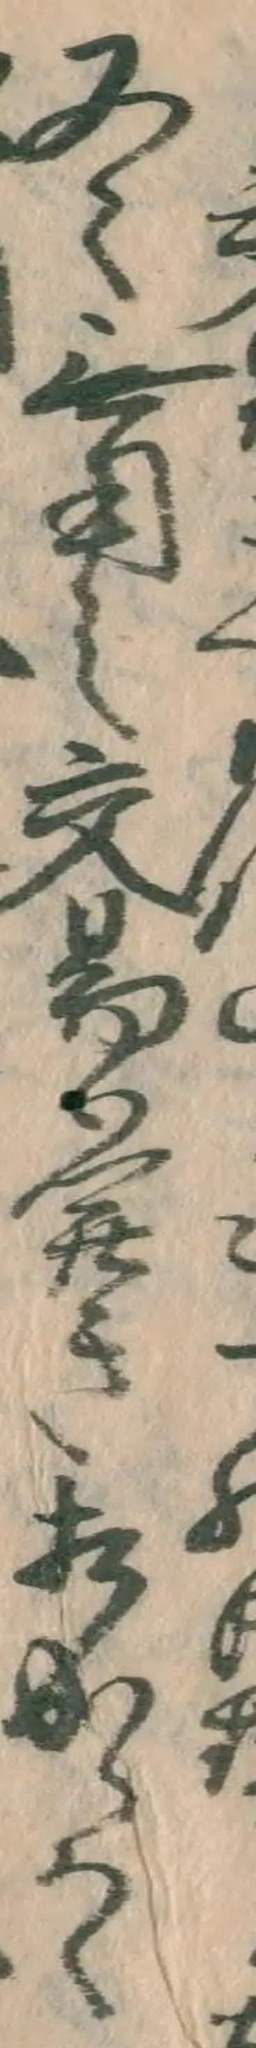又々無用之交易御開き相成候ハヽ
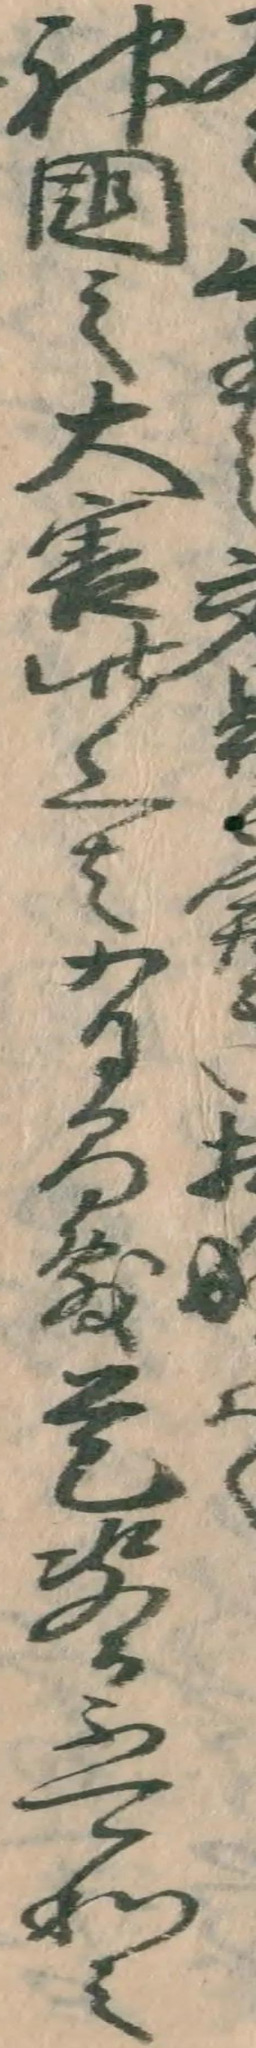神国之大害此上者有間敷是決而不可和之
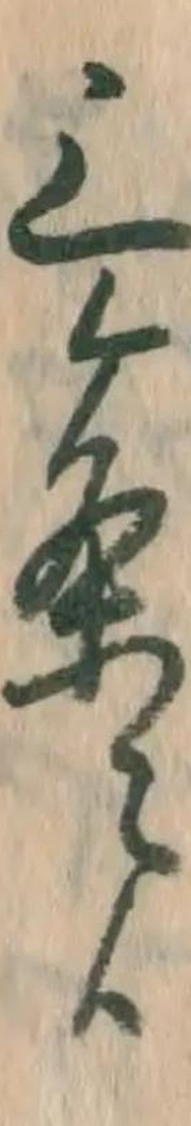三ケ条ニ候

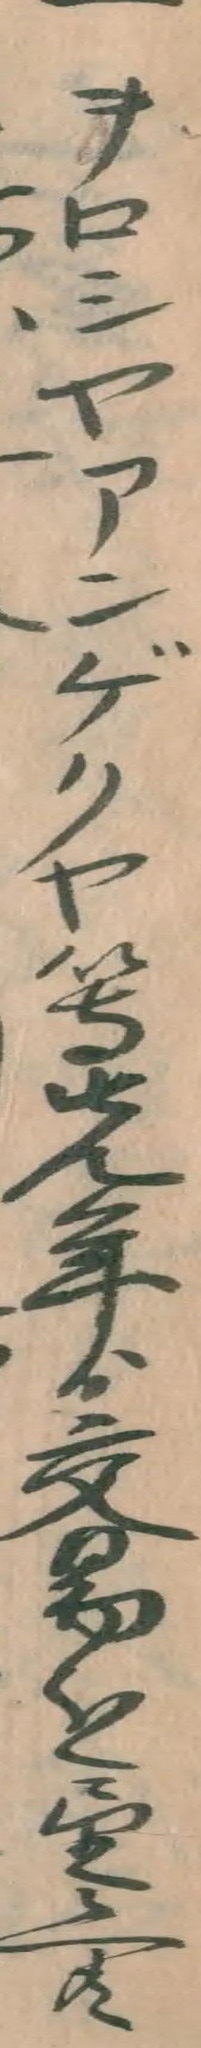一ヲロシヤアンゲリヤ等先年ゟ交易を望候へ共
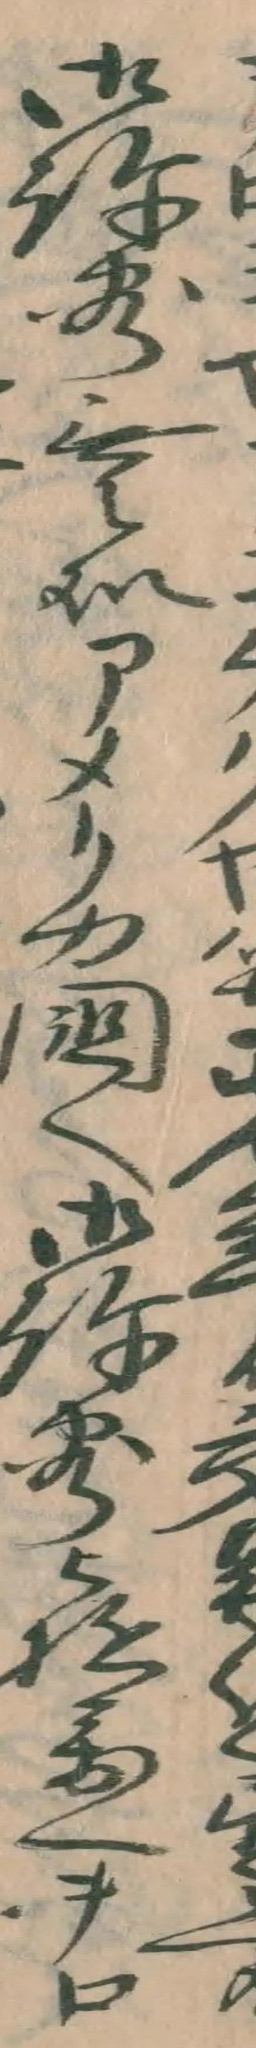御許容無之処アメリカ国へ御許容被遊萬一ヲロ
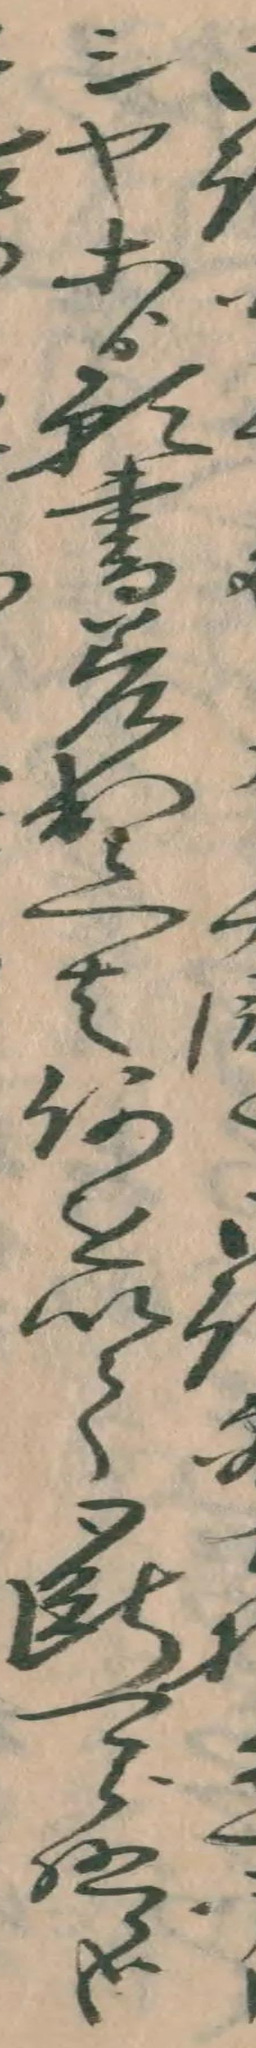シヤ等ゟ願書差出候へ者何を以て御断可被遊候哉
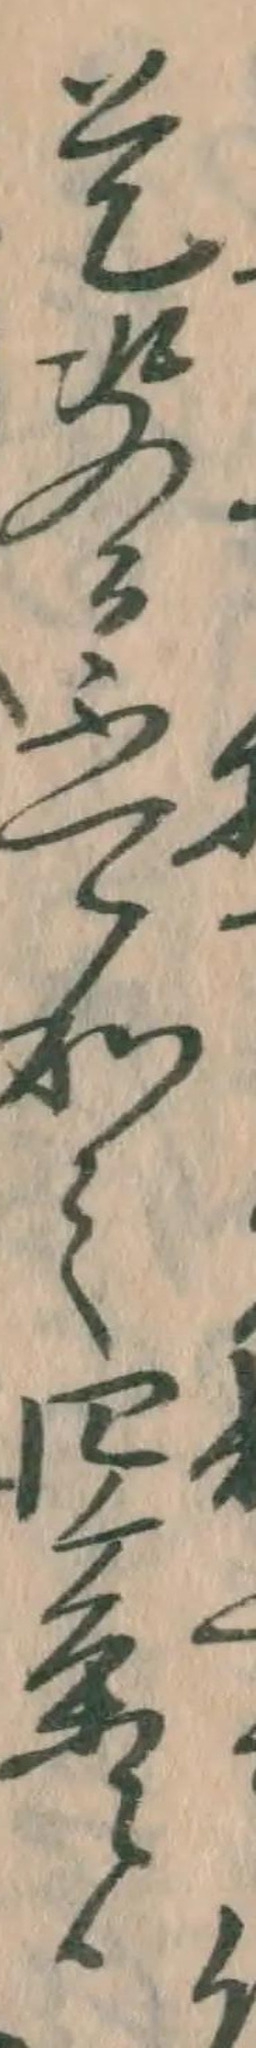是決而不可和之四ケ条ニ候
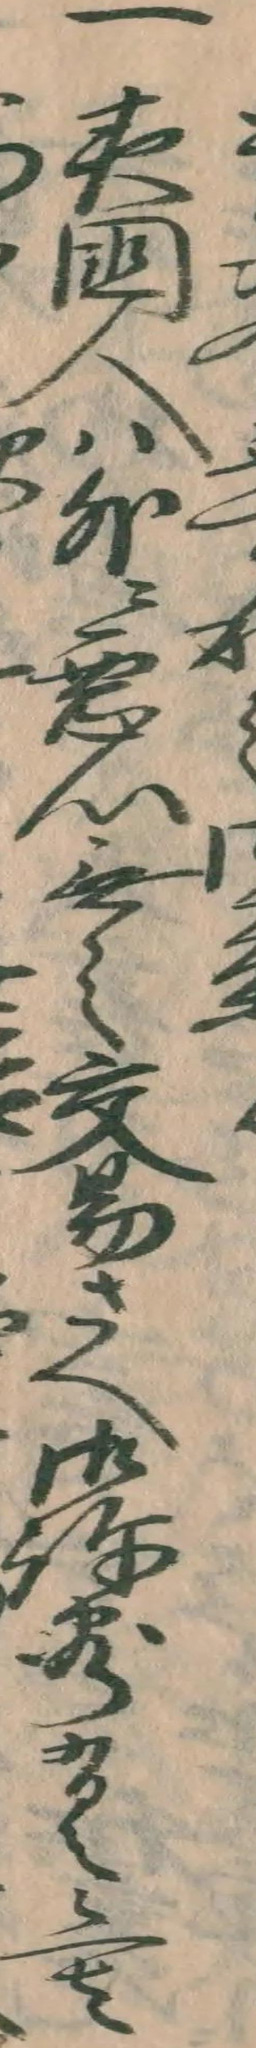一夷国人ハ外ニ悪心無之交易さへ御許容有之候へ者
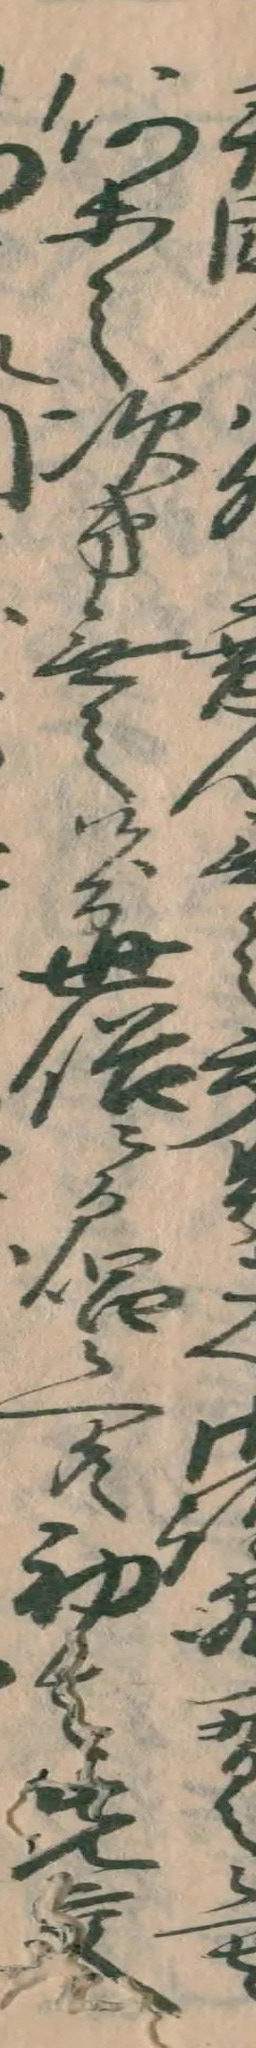何等之次第無之候旨世俗二而唱候へ共初者先交
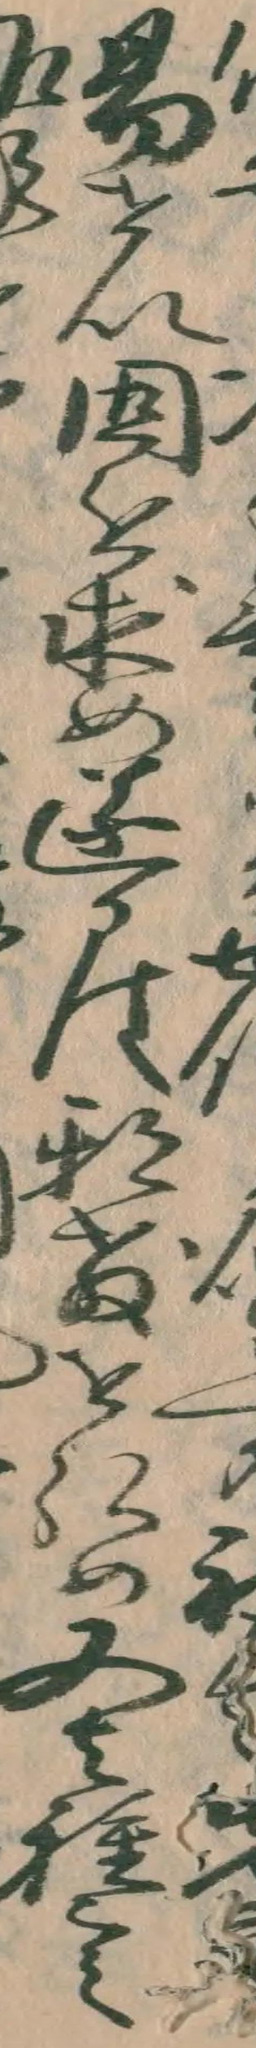易を以固を求め遂には邪教を弘め又者種々之
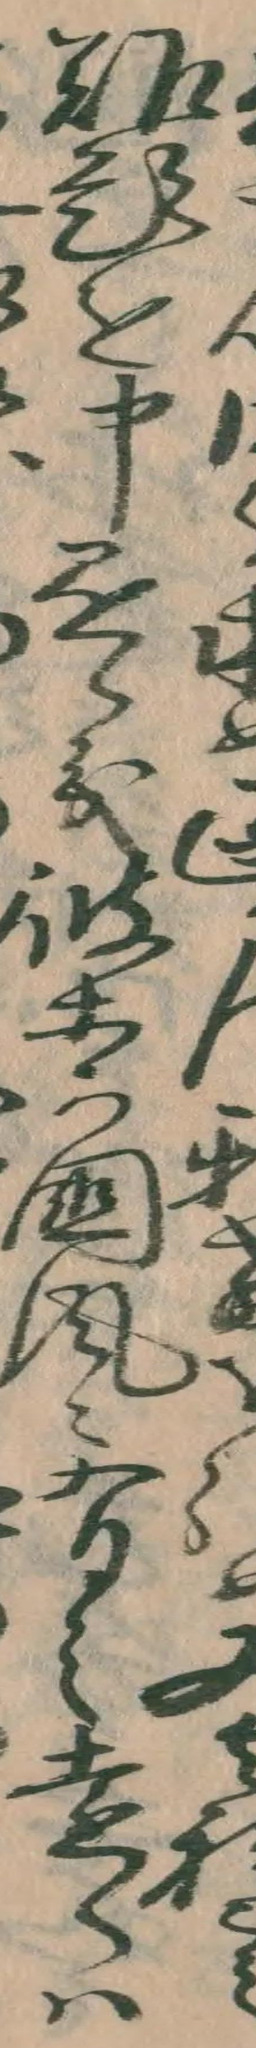難題を申懸候義彼等か国風ニ有之遠くハ
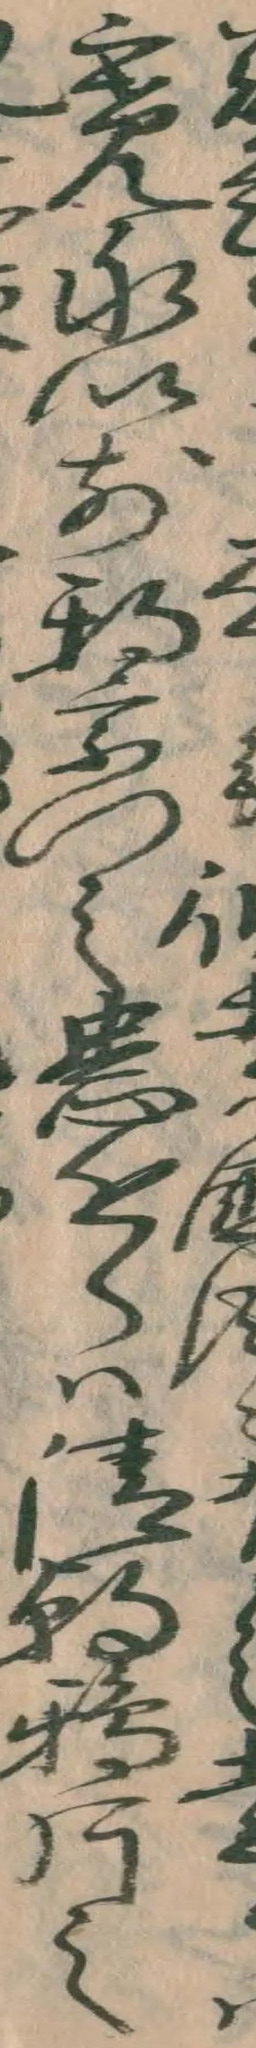寛永以前邪宗門之患近くハ清朝鴉片之
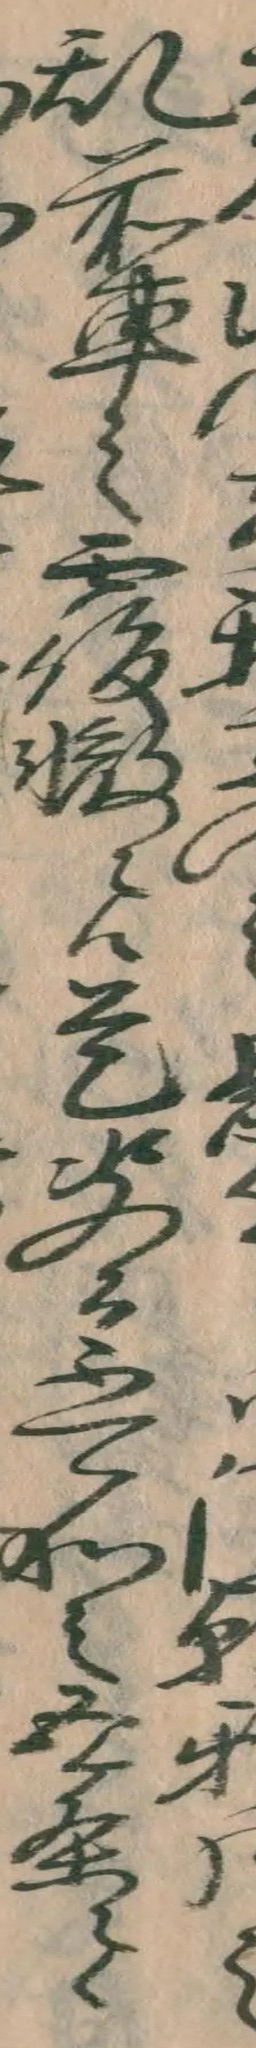乱前車之覆轍ニ候是決而不可和之五ケ条ニ候
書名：麗斎叢書. 20
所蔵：国立国会図書館 National Diet Library, JAPAN
